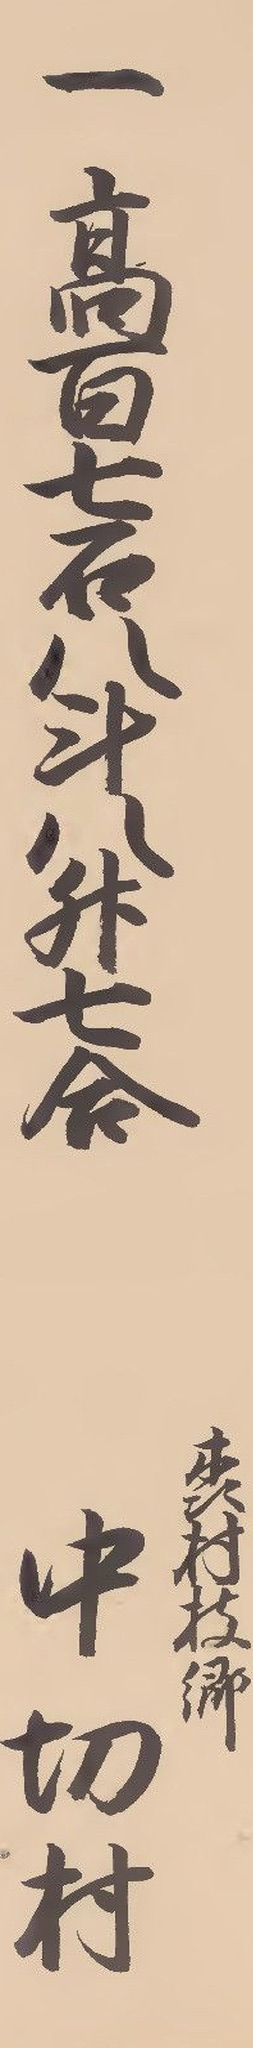一髙百七石八斗八升七合中切村
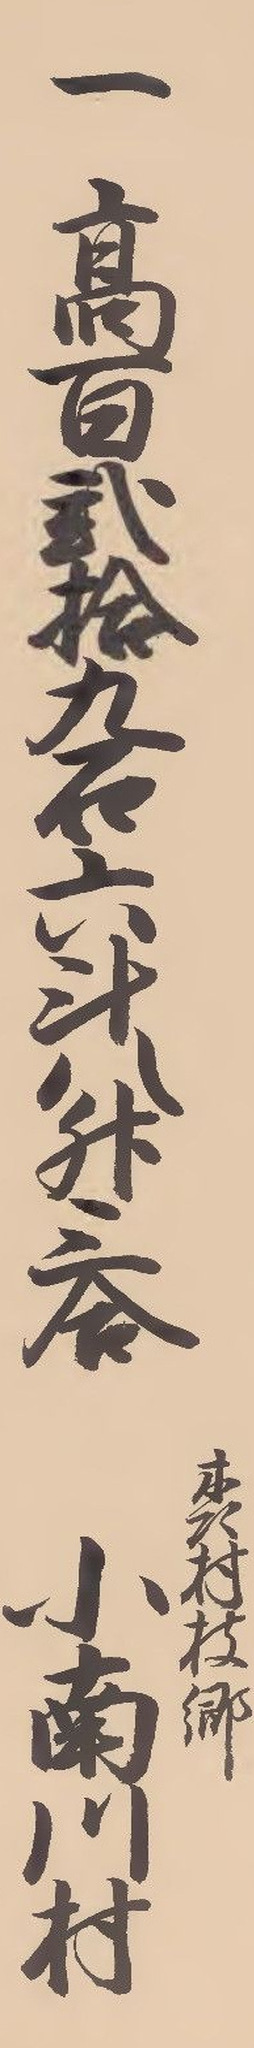一髙百弐拾九石六斗八升三合小南川村
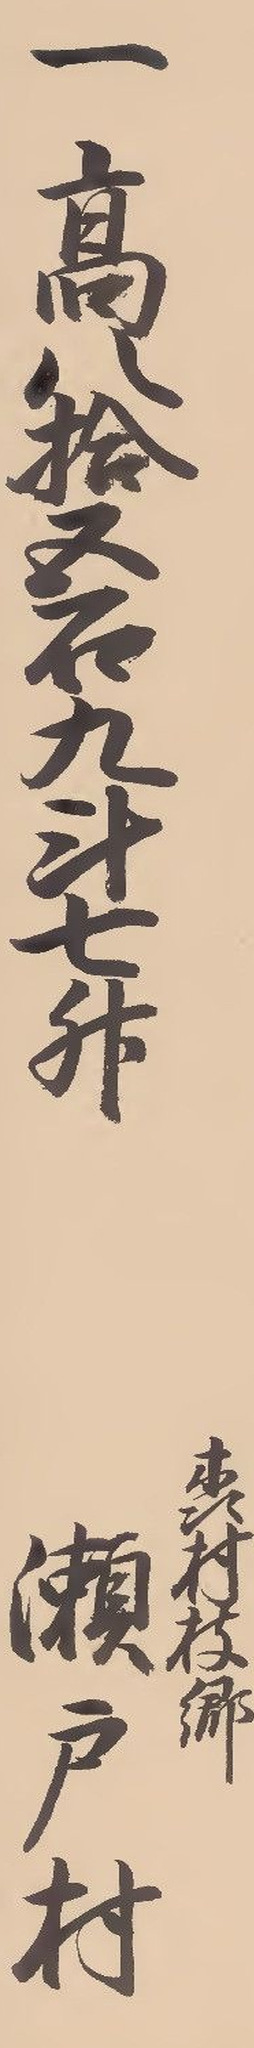一髙八拾五石九斗七升瀬戸村
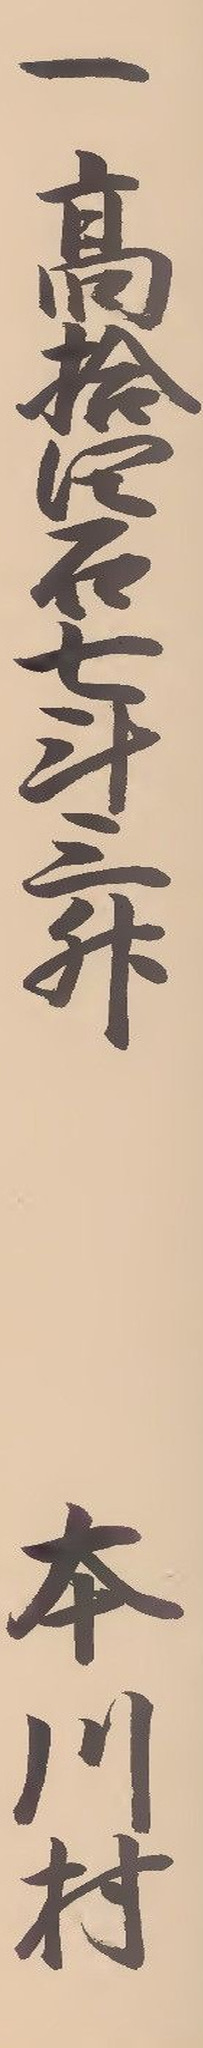一髙拾四石七斗三升本川村
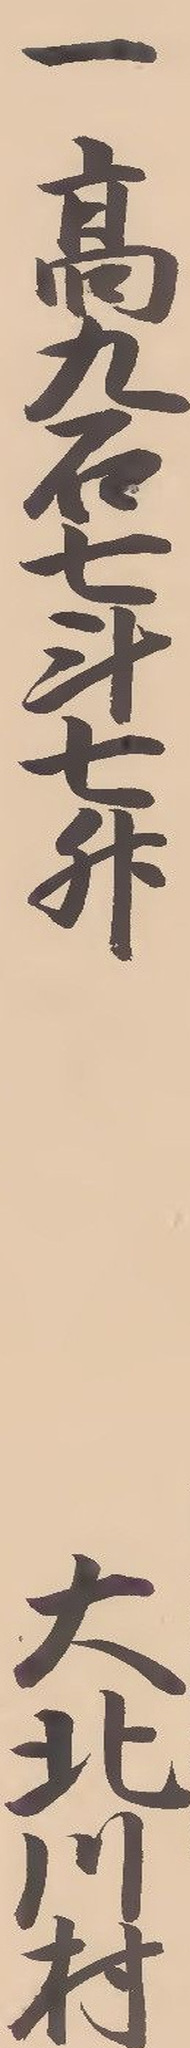一髙九石七斗七升大北川村

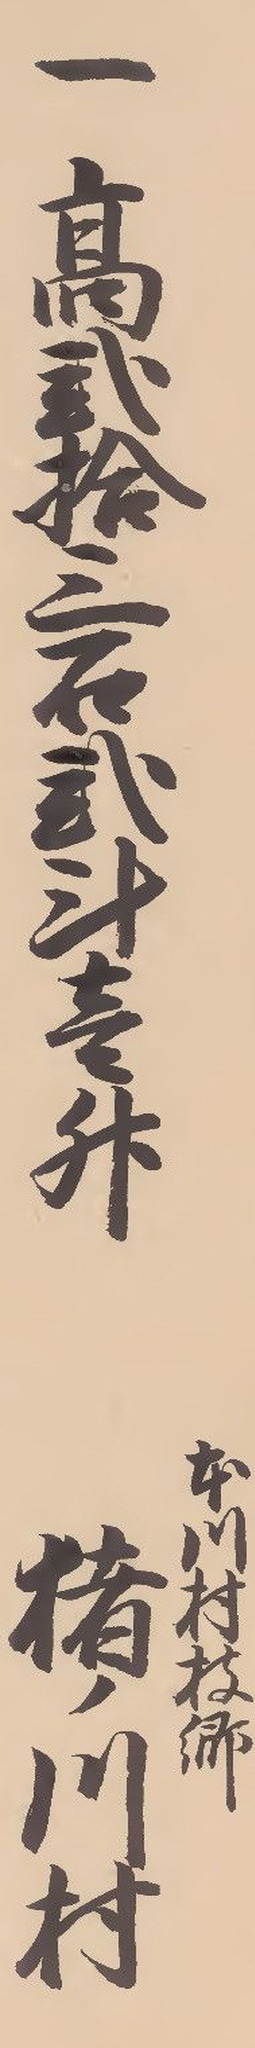一髙弐拾三石弐斗壱升猪ノ川村
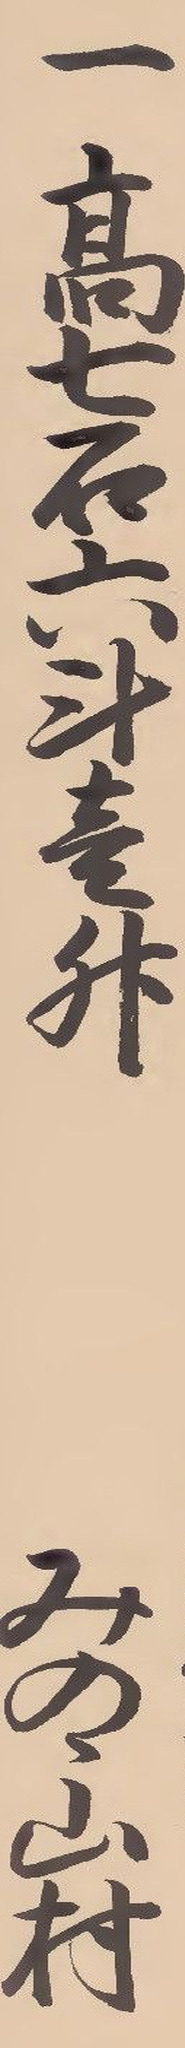一髙七石六斗壱升みの山村
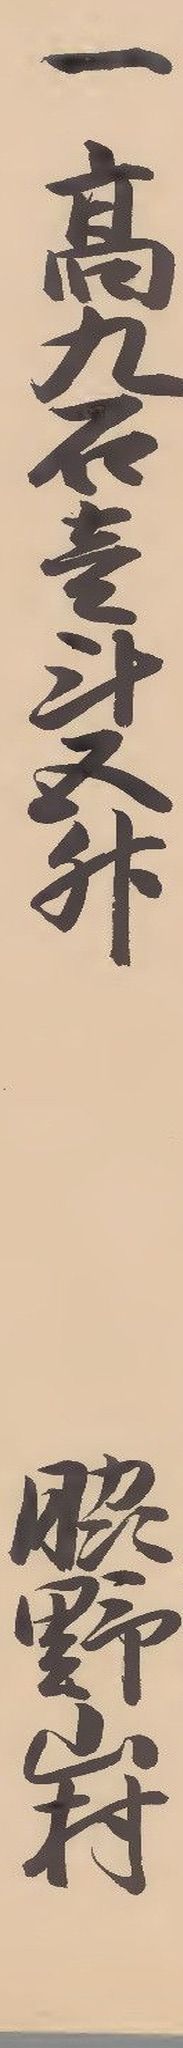一髙九石壱斗五升脇野山村
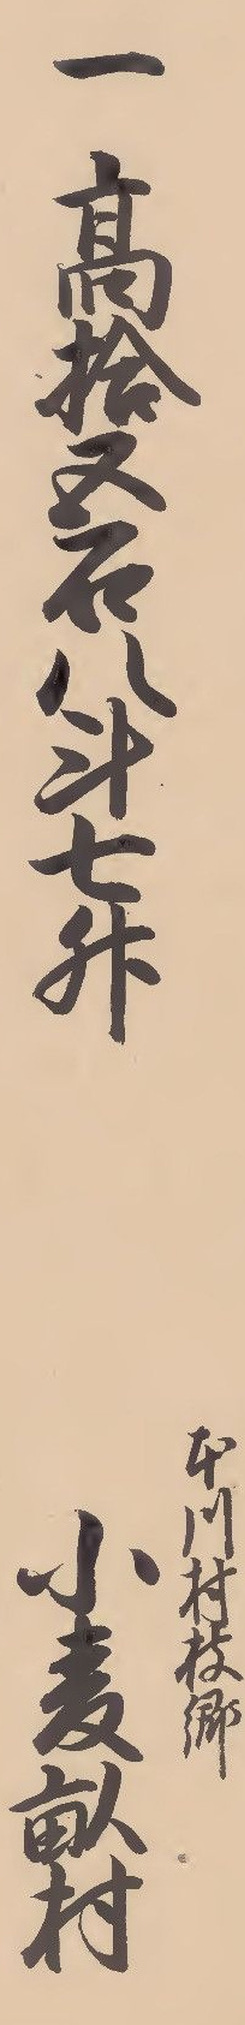一髙拾五石八斗七升小麦畝村
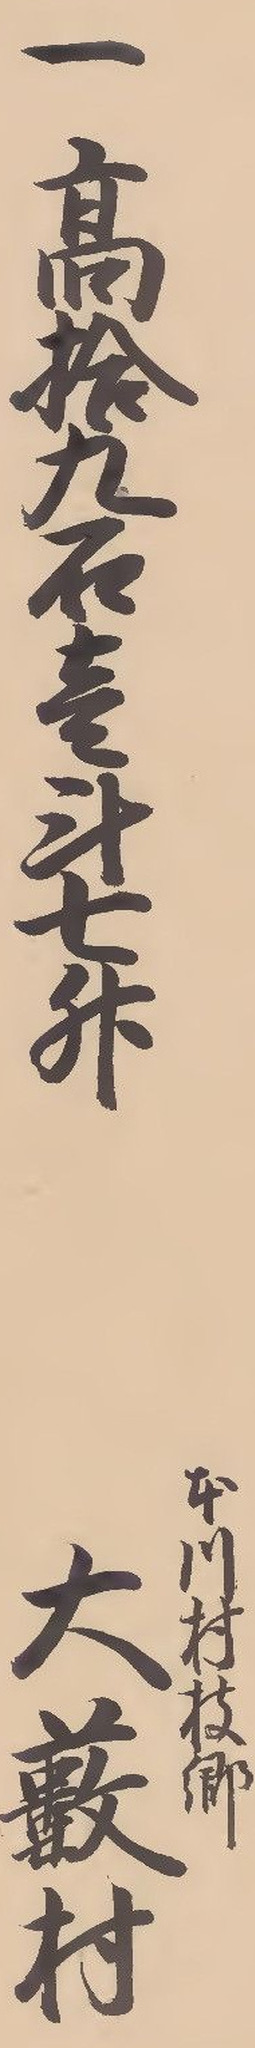一髙拾九石壱斗七升大藪村

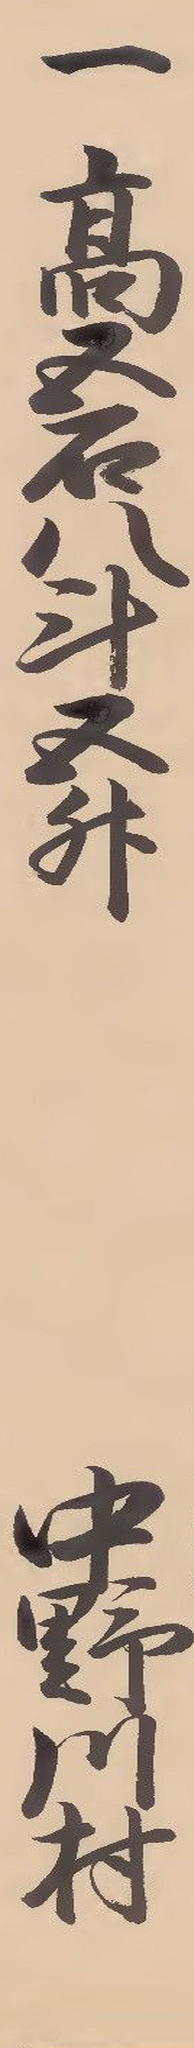一髙五石八斗五升中野川村

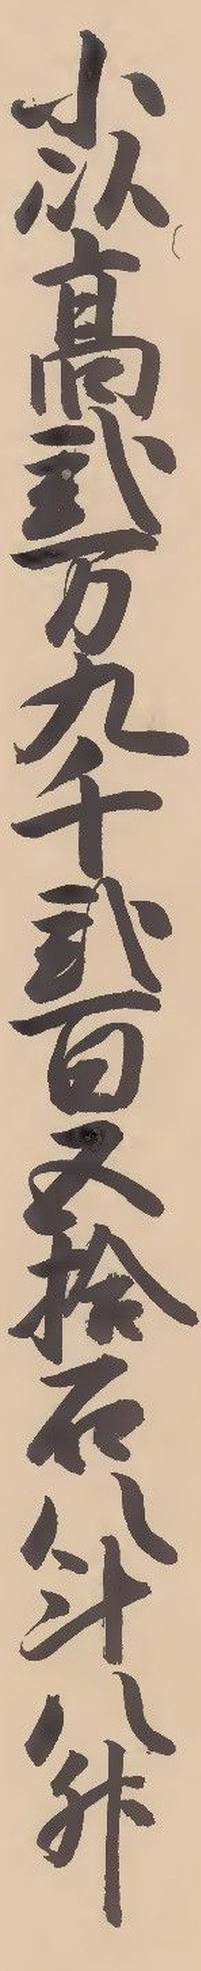小以髙弐万九千弐百五拾石八斗八升
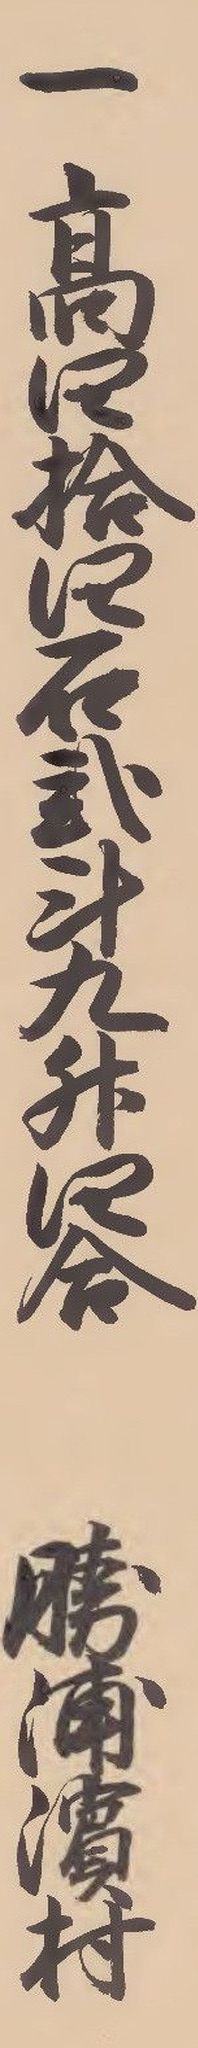一髙四拾四石弐斗九升四合勝浦濱村
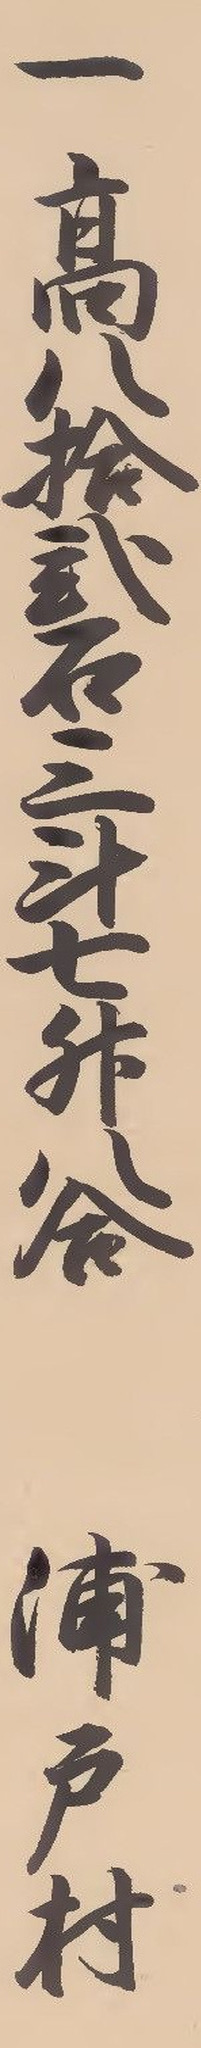一髙八拾弐石三斗七升八合浦戸村
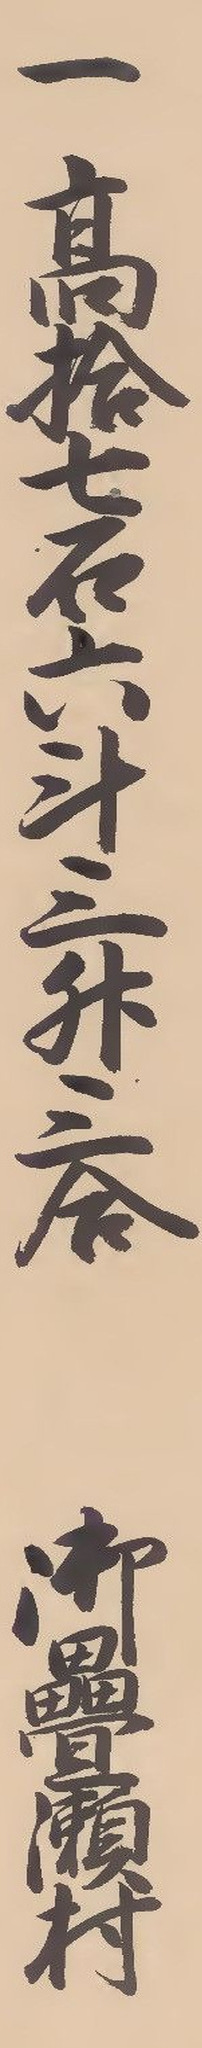一髙拾七石六斗三升三合御疊瀬村

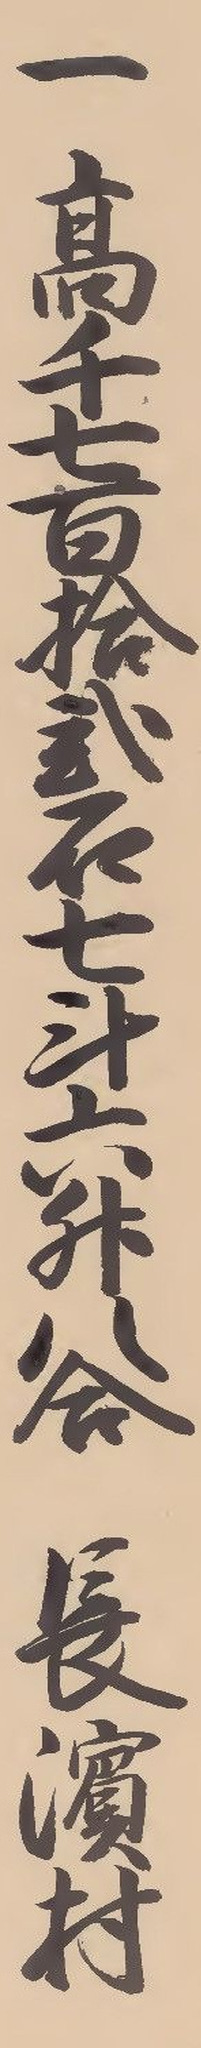一髙千七百拾弐石七斗六升八合長濱村
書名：土佐国郷帳
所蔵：国立公文書館 National Archives of Japan
